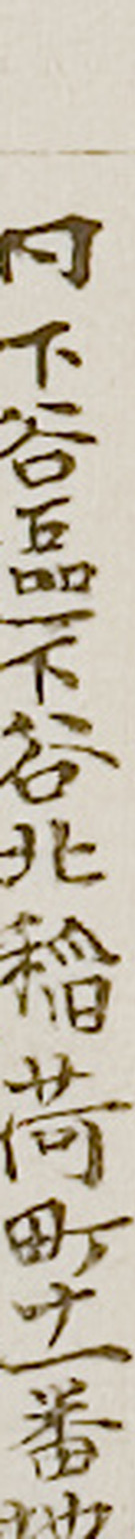同下谷区下谷北稲荷町十一番地
